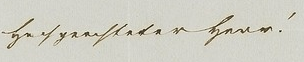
Hochgeachteter Herr!
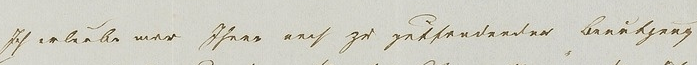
Ich erlaube mir Ihnen noch zu gutfindender Benützung
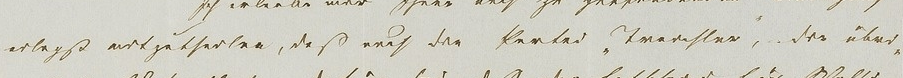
eiligst mitzutheilen, daß auch die Partei «Treichler», die übri-
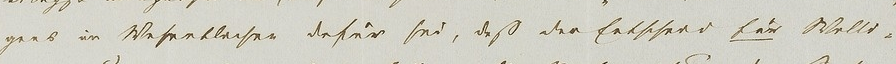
gens im Wesentlichen dafür sei, daß der Entscheid fürWalli-
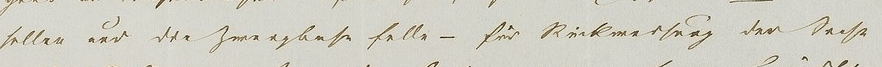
sellen und die Zweigbahn falle – für Rückweisung der Sache
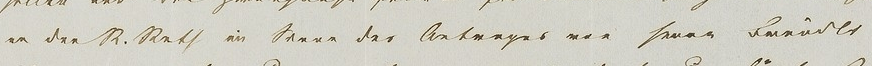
an den R.rath im Sinne des Antrages wie Herrn Brändli
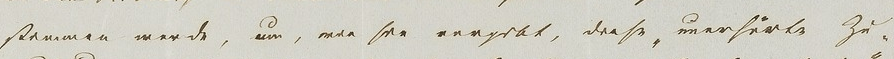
stimmen werde, um, wie sie vorgibt, diese «unerhörte Zu-
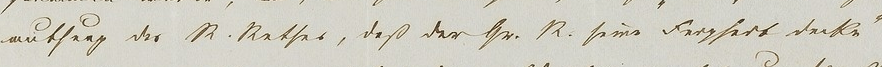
muthung des R.Rathes, daß der Gr. R. seine Feigheit decke»
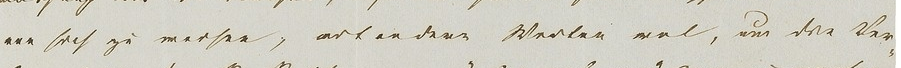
von sich zu weisen, mit andern Worten wol, um die Ver-
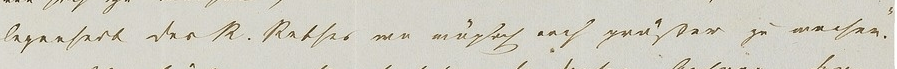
legenheit des R.Rathes wo möglich noch größer zu machen.
